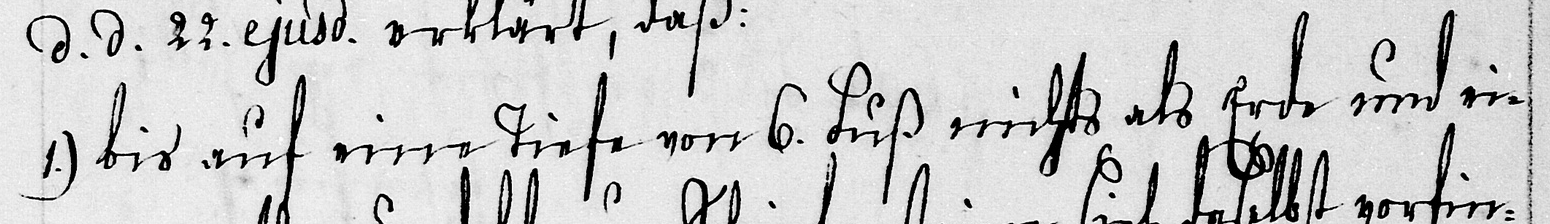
1.) bis auf eine Tiefe von 6. Fuß nichts als Erde und ei¬
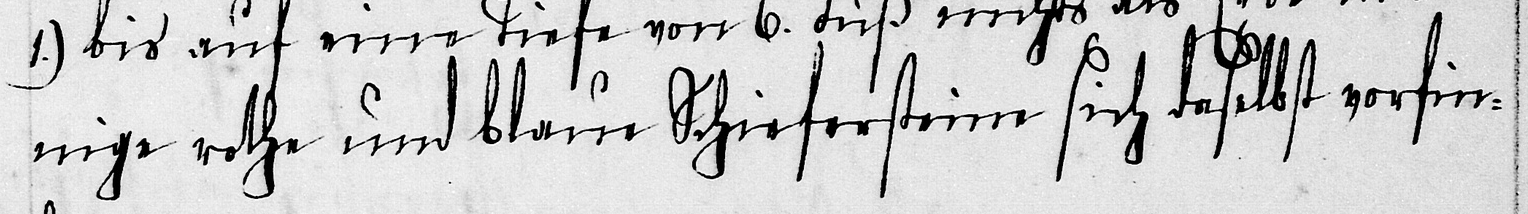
nige rothe und blaue Schiefersteine sich daselbst vorfi¬
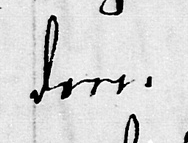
nden.
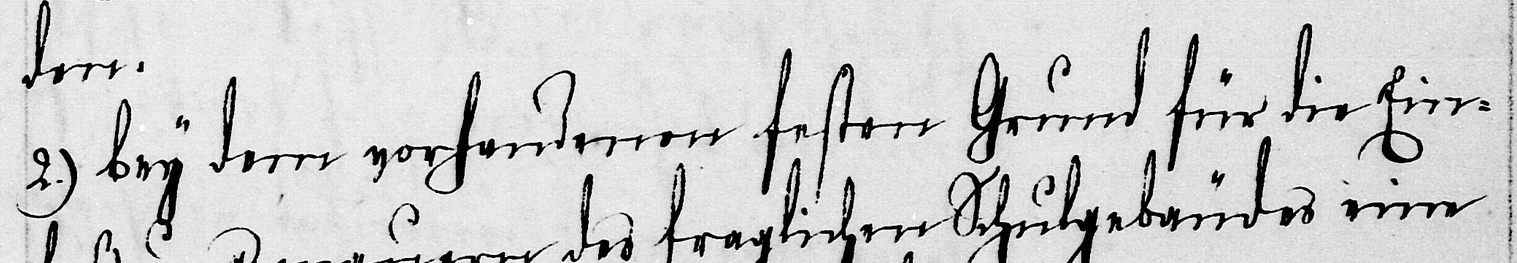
2.) bey dem vorhandenen festen Grund für die Ein¬
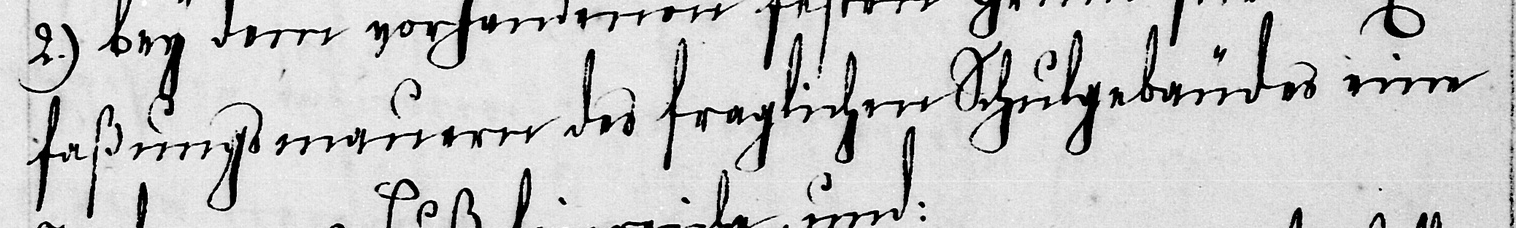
faßungsmauern des fraglichen Schulgebäudes eine
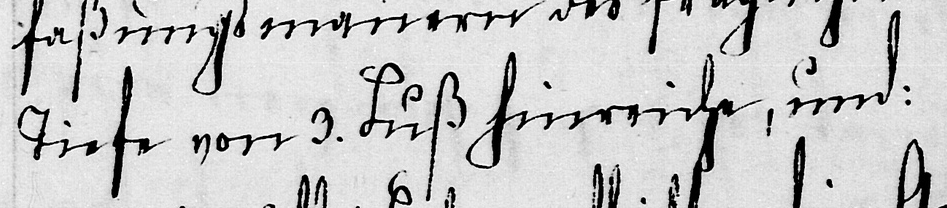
Tiefe von 3. Fuß hinreiche, und:
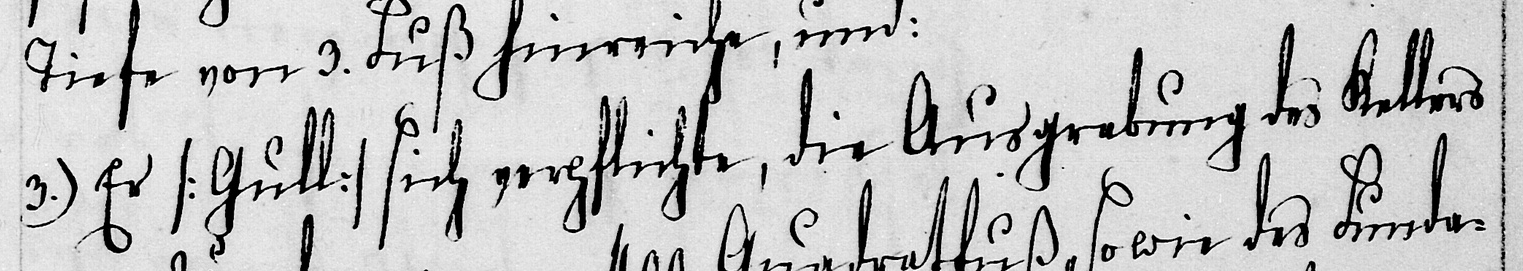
3.) Er [Gull] sich verpflichte, die Ausgrabung des Kellers
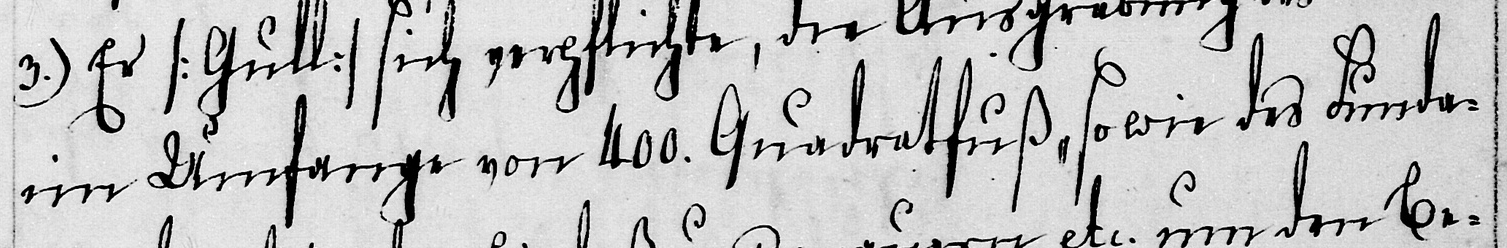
im Umfange von 400. Quadratfuß, sowie des Funda¬
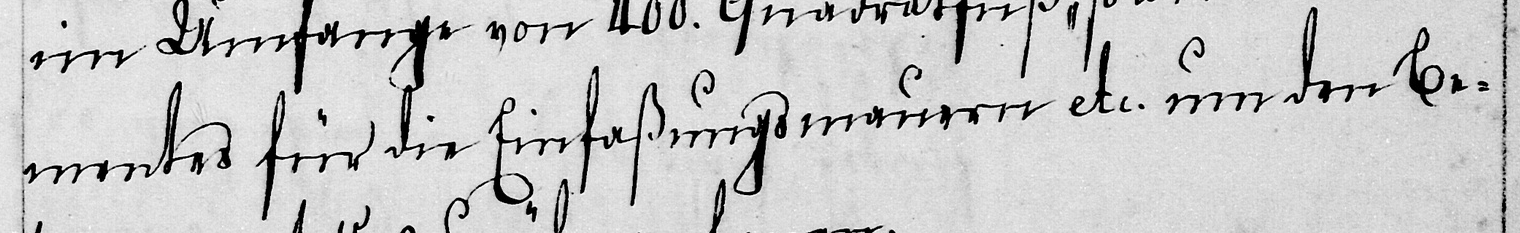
mentes für die Einfaßungsmauern etc. um den Be¬
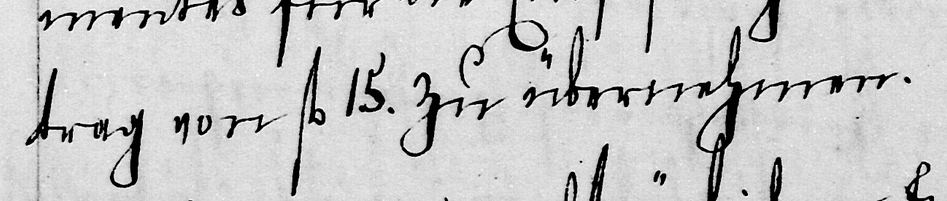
trag von fl. 15. zu übernehmen.
